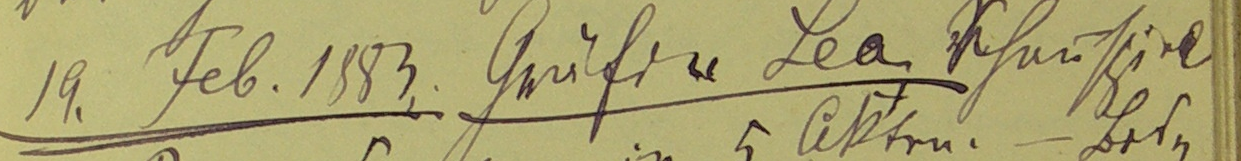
19. Februar .“ Gräfin Lea“…Schauspiel
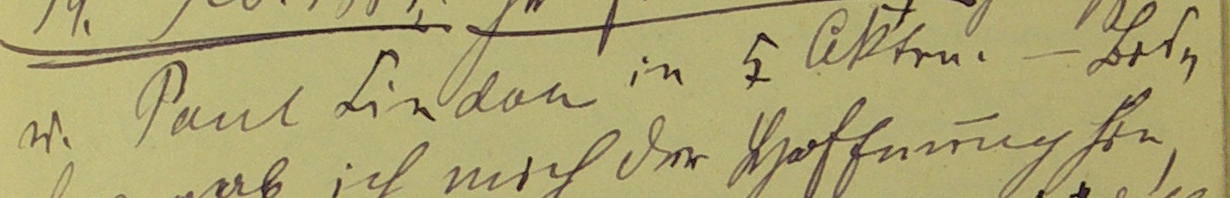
von Paul Lindau in 4 Akten. Bis¬
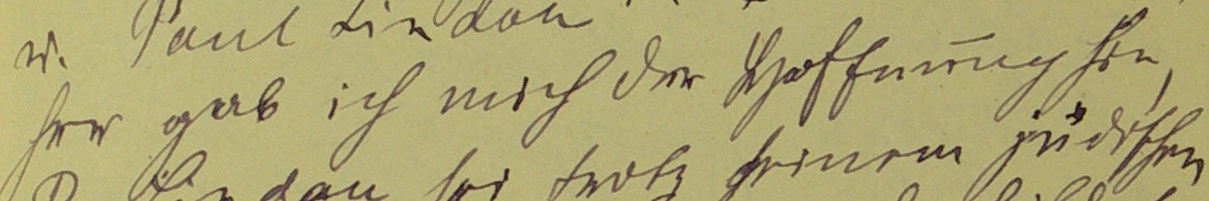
her gab ich mich der Hoffnung hin
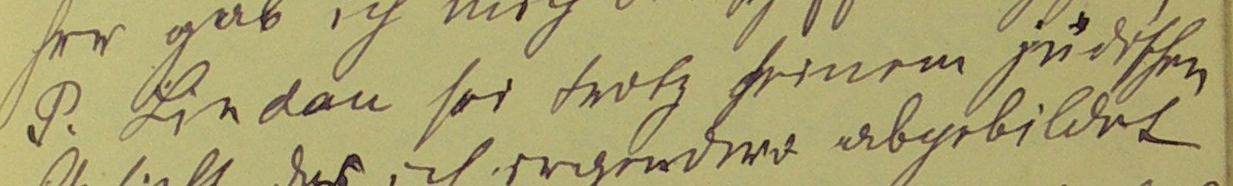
P.Lindau sei trotz seines jüdischen
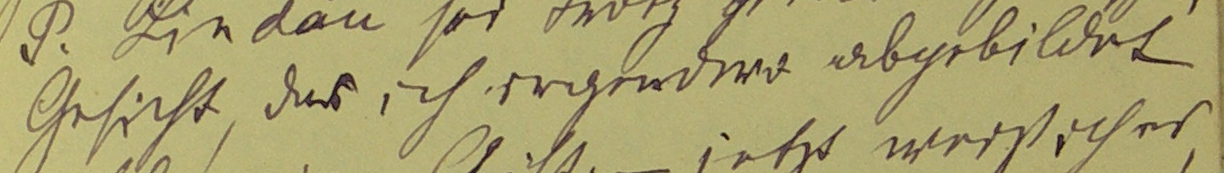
Gesichts das ich irgendwo abgebildet
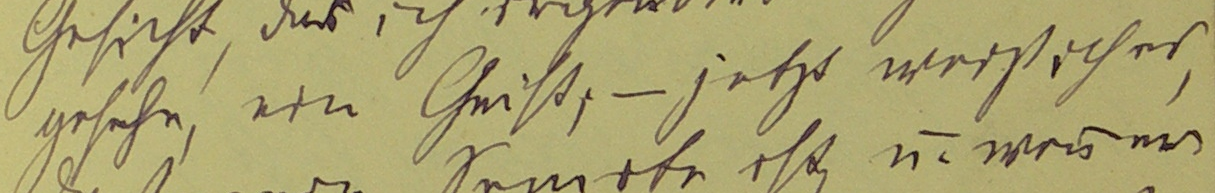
gesehen, ein Christ .- Jetzt weiß ich es
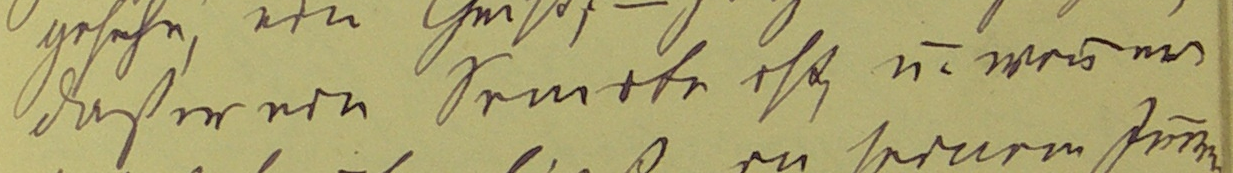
daß er ein Semite ist, und weiß er
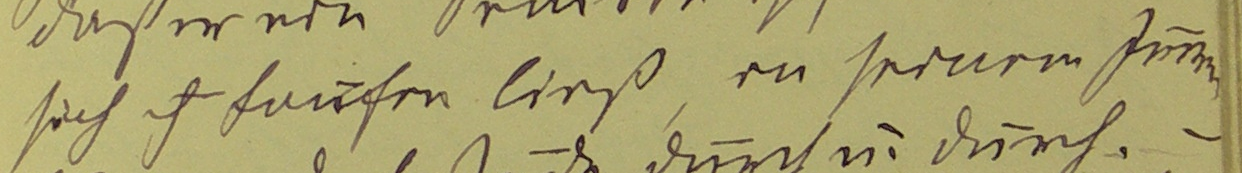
sich auch taufen ließ, in seinem Inneren
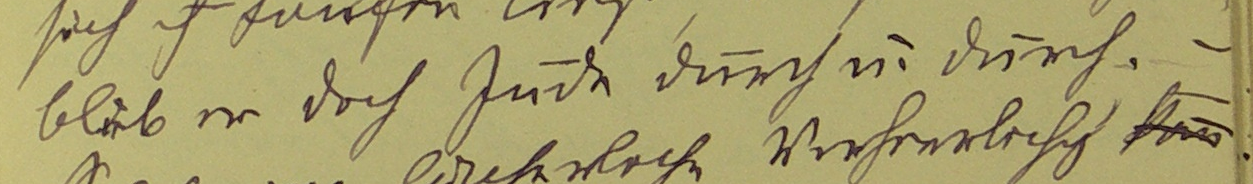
blieb er doch Jude durch und durch.-
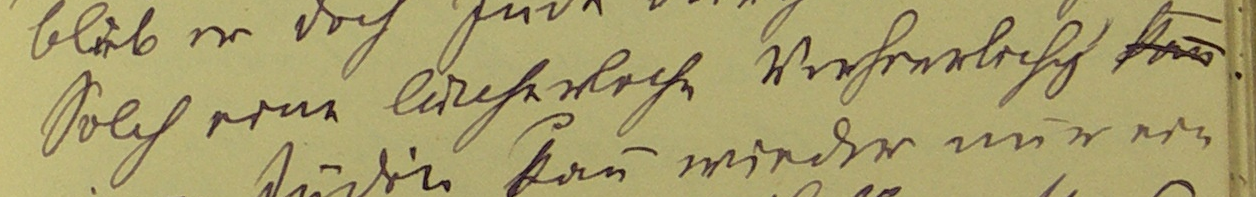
Solch eine lächerliche Verherrlichung
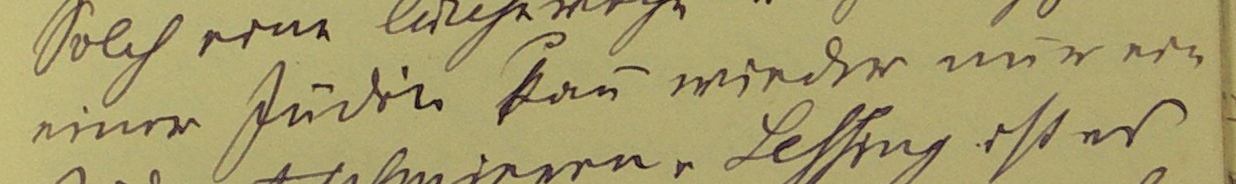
einer Jüdin kann wieder nur ein
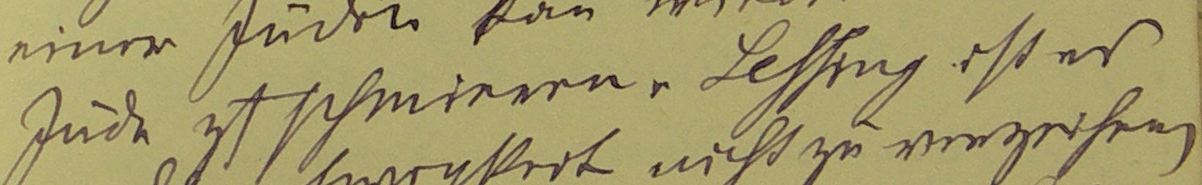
Jude zusammenschmieren. Lessing ist es
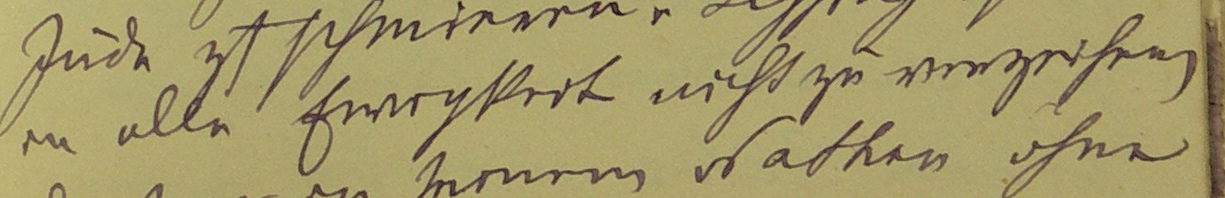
in alle Ewigkeit nicht zu verzeihen
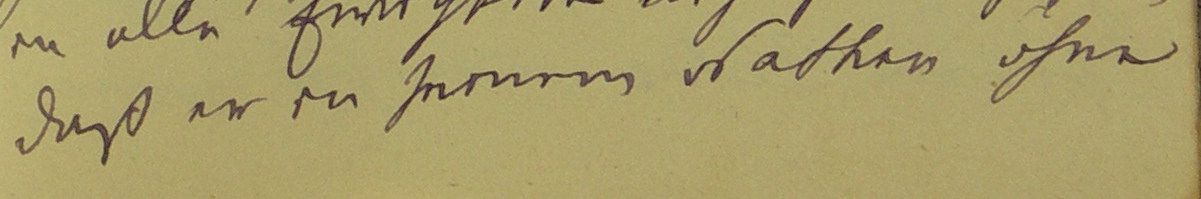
daß er in seinem Nathan ohne
